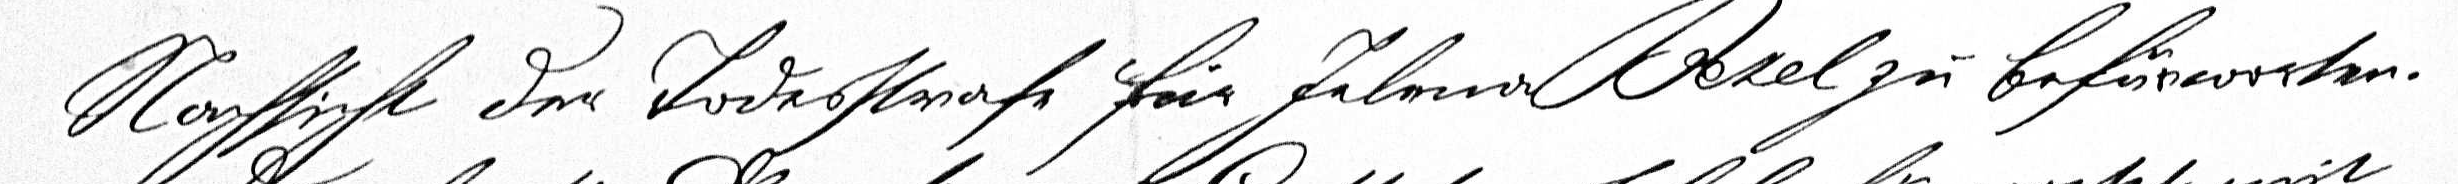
Nachsicht der Todesstrafe für Jelena Bezel zu befürworten.
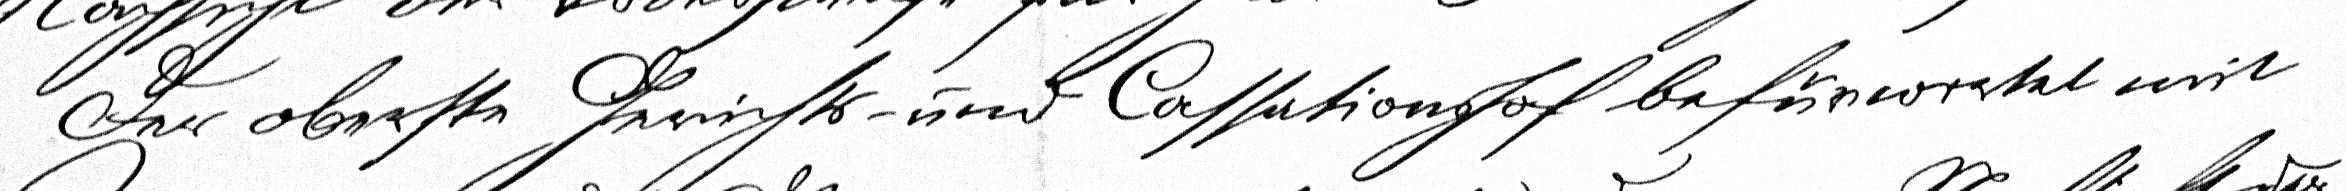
Der oberste Gerichts- und Cassationshof befürwrotet mit
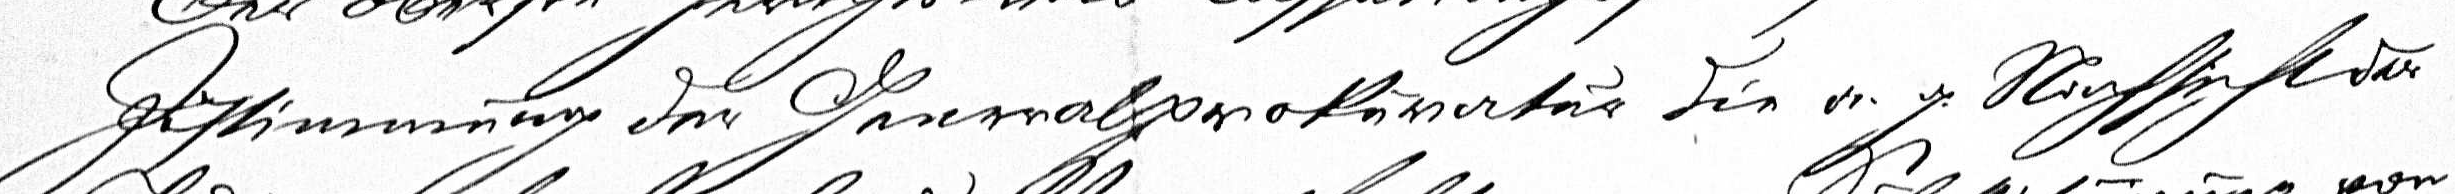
Zustimmung der Generalprokuratur die a.g. Nachsicht der
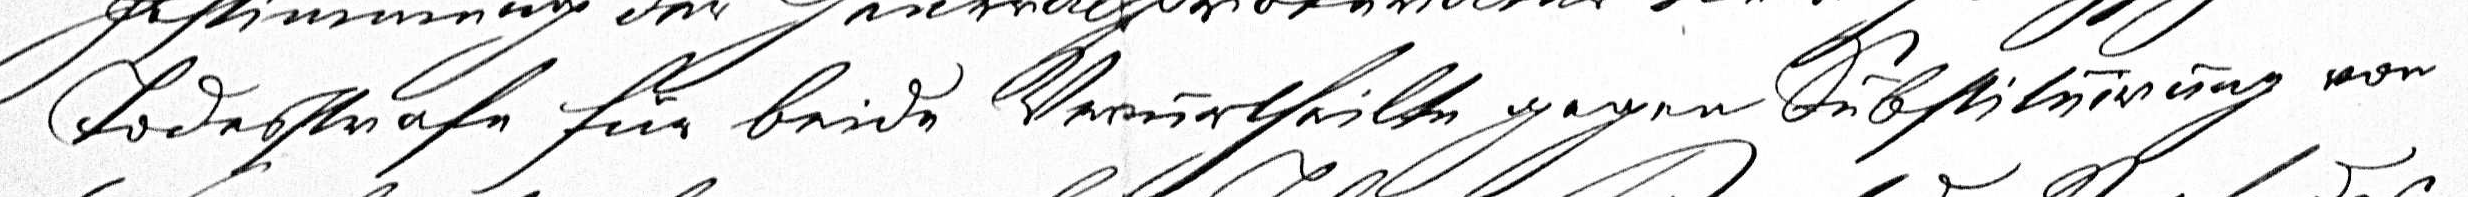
Todesstrafe für beide Verurtheilte gegen Substituirung von
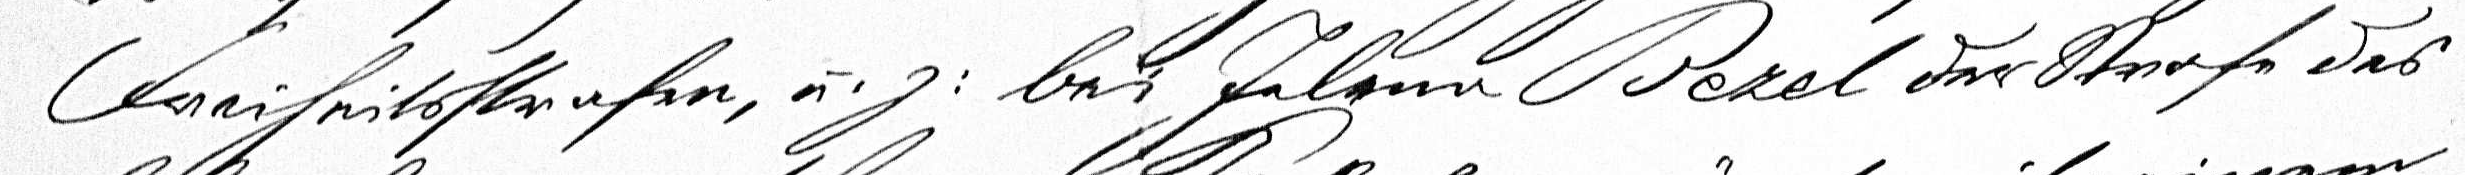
Freiheitsstrafen, u. Z: bei Jelena Bezel der Strafe des
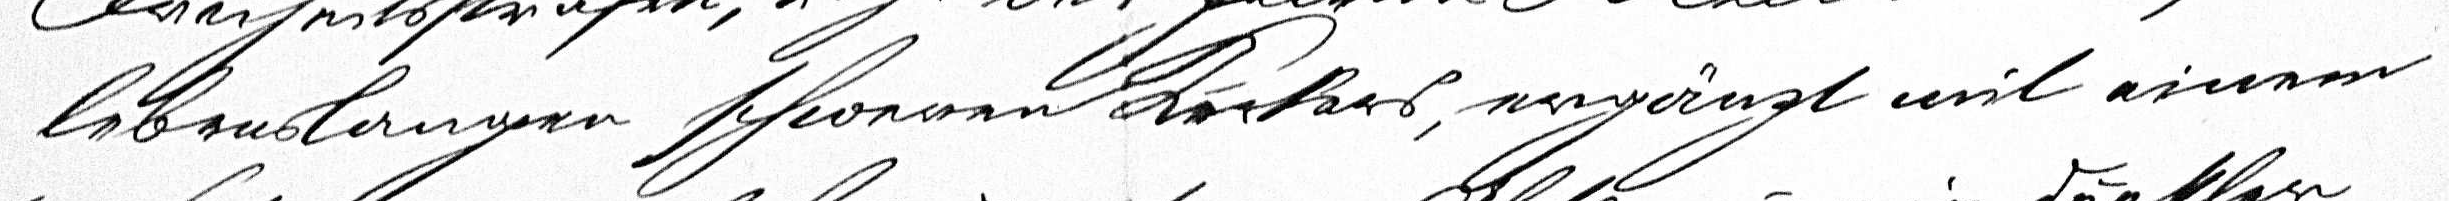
lebenslangen schweren Kerkers, ergänzt mit einem
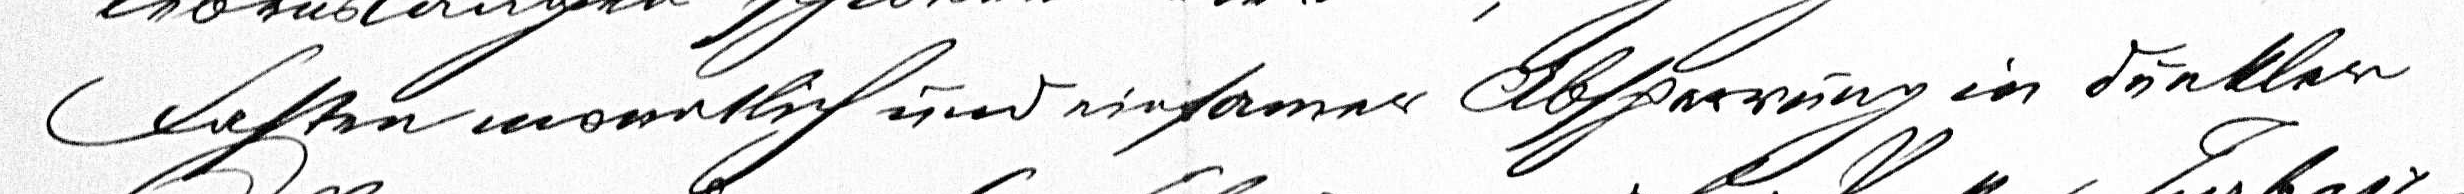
Fasten monatlich und einsamer Absperrung in dunkler
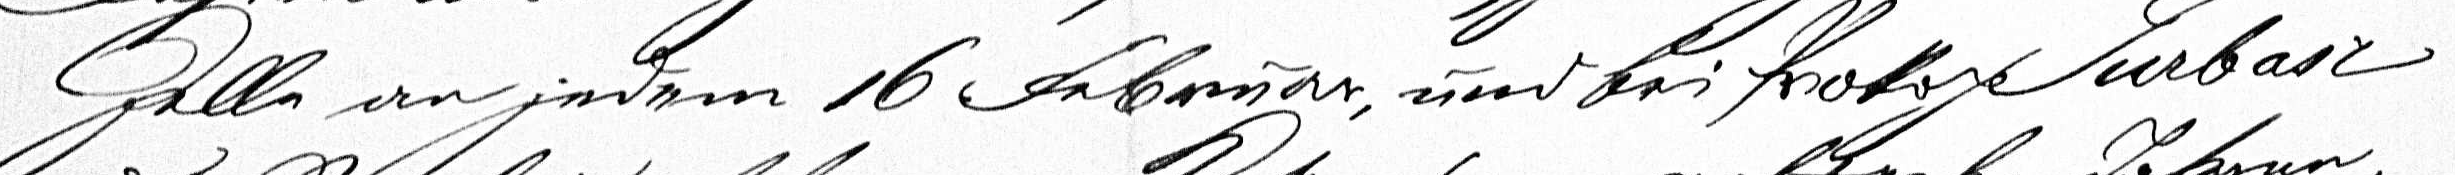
Zelle an jedem 16 Februar, und bei Prokop Iurbasz
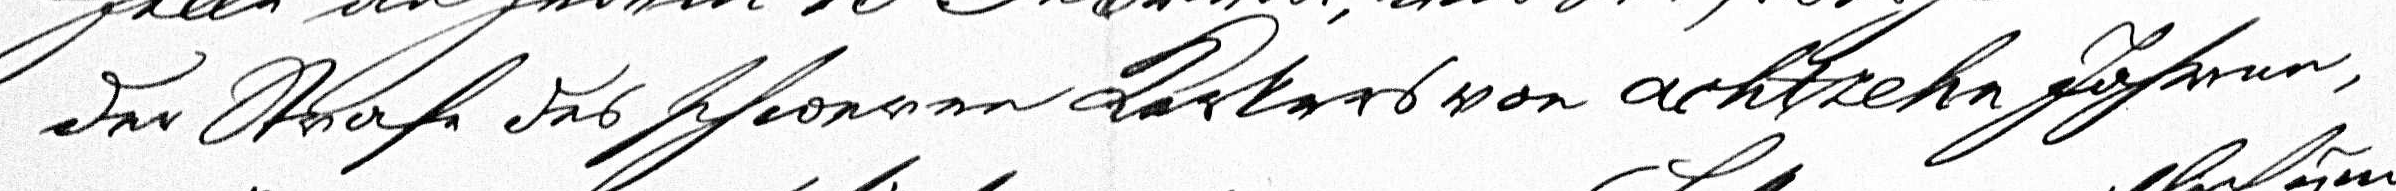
der Strafe des schweren Kerkers von achtzehn Jahren,
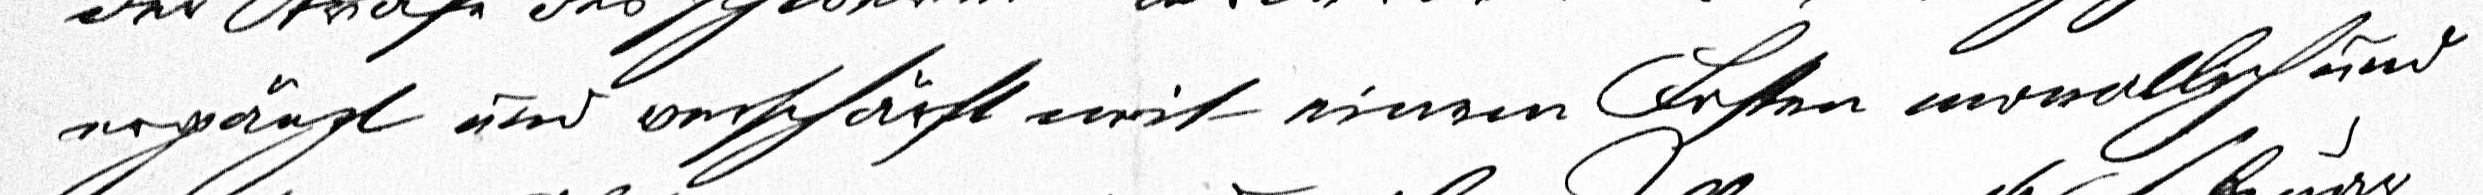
ergänzt und verschärft mit einem Fasten monatlich und
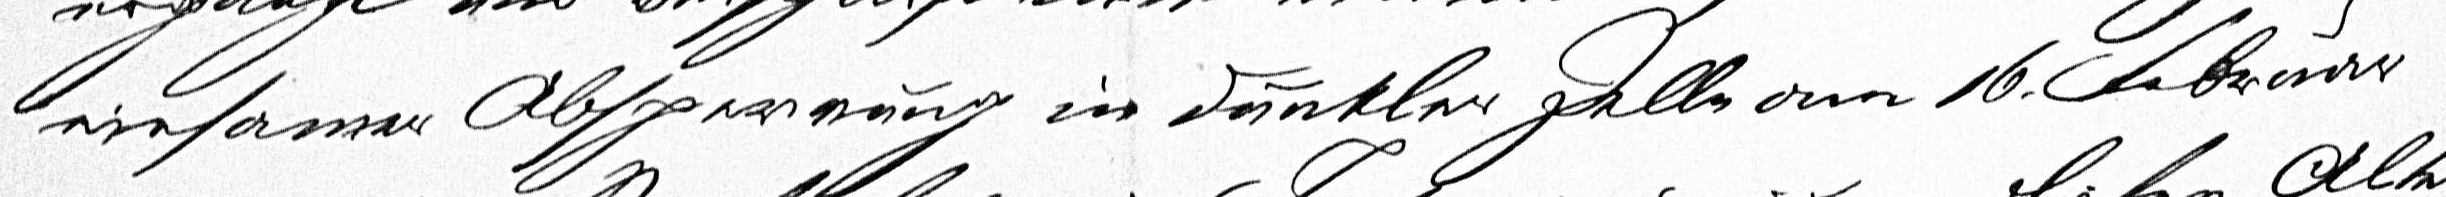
einsamer Absperrung in dunkler Zelle am 16. Februar
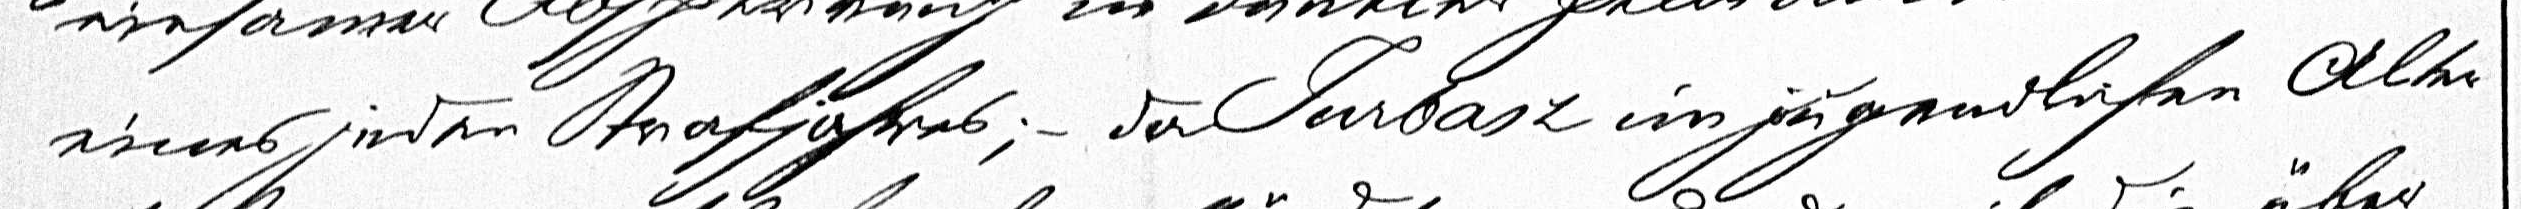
eines jeden Strafjahres; da Iurbasz im jugendlichen Alter
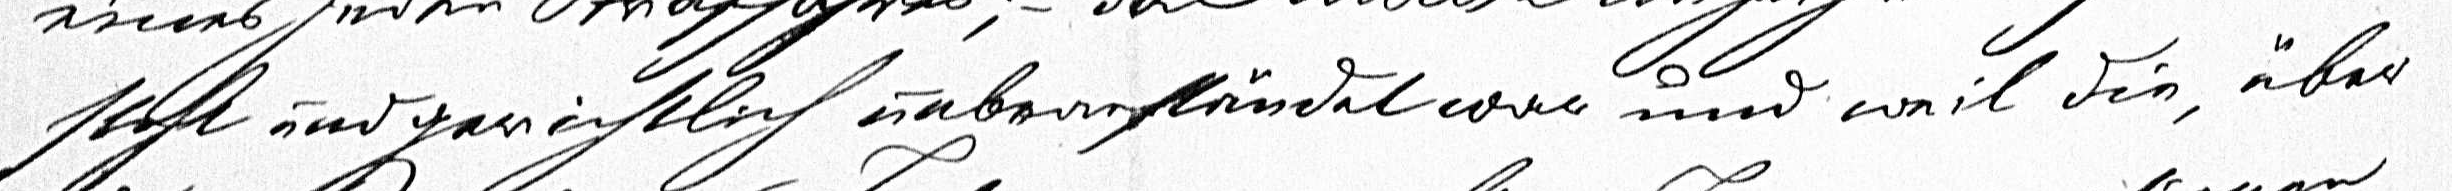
steht und gerichtlich unbeanständet war und weil die, über
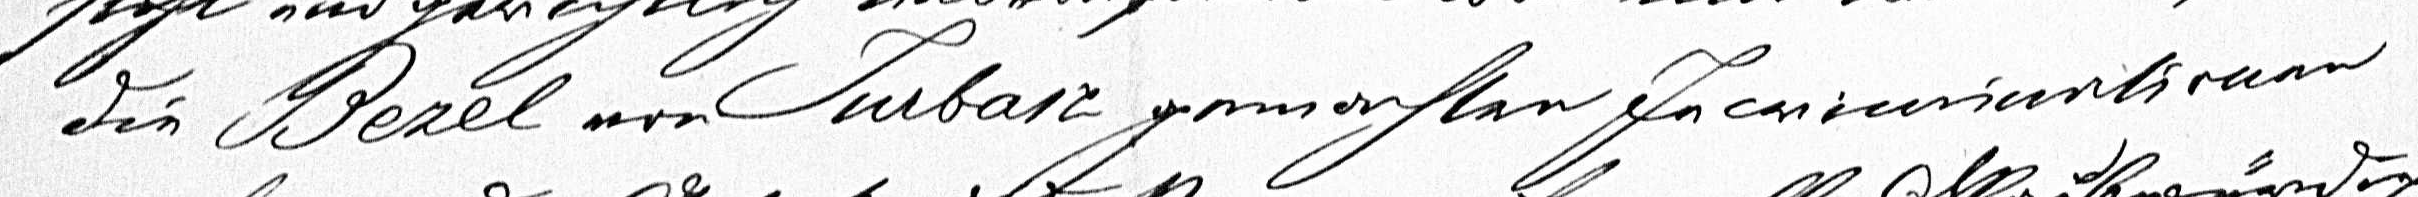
die Bezel von Iurbasz gemachten Incriminaticum
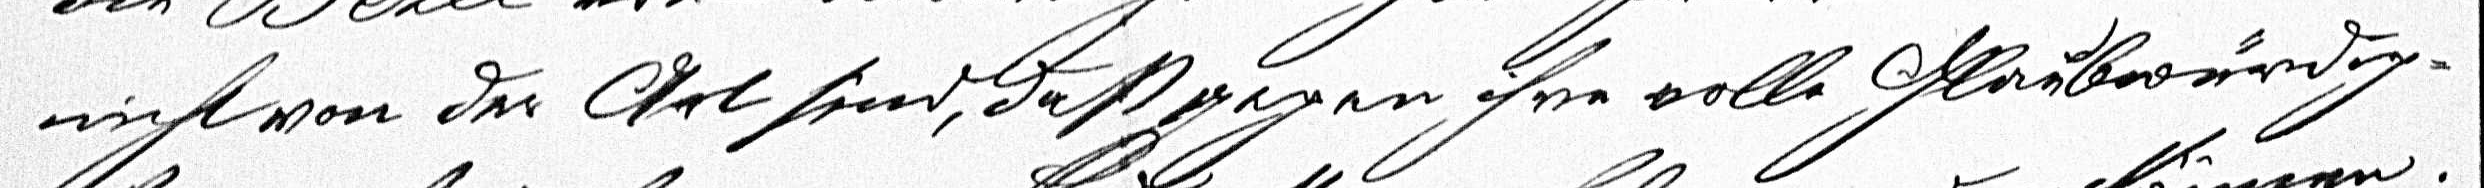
nicht von der Art sind, daß gegen ihre volle Glaubwürdig¬
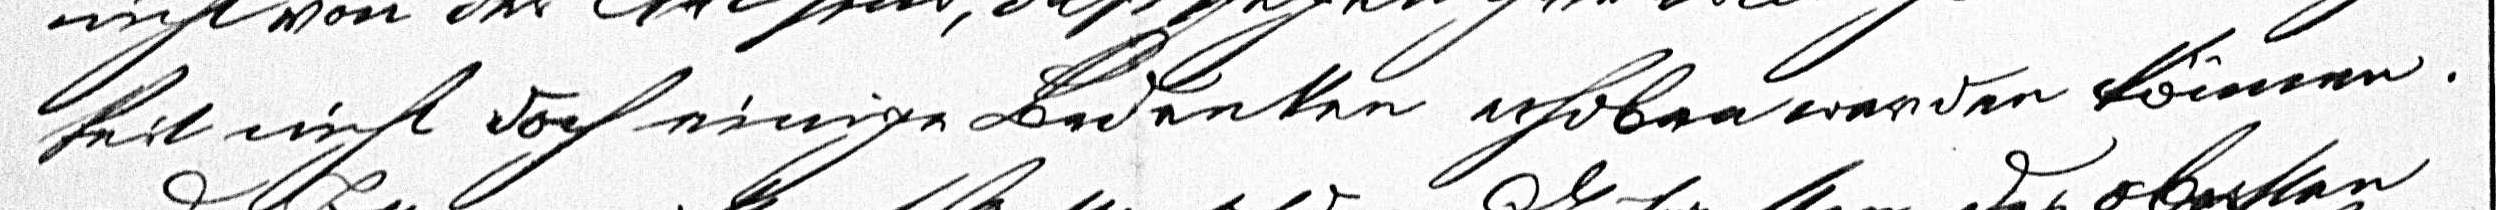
keit nicht doch einige Bedenken erhoben werden können.
